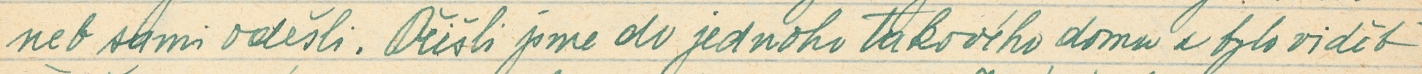neb sami odešli. Přišli jsme do jednoho takového domu a bylo vidět
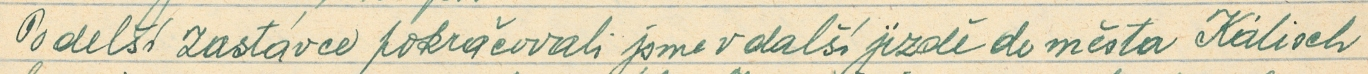Po delší zastávce pokračovali jsme v další jízdě do města Kalisch
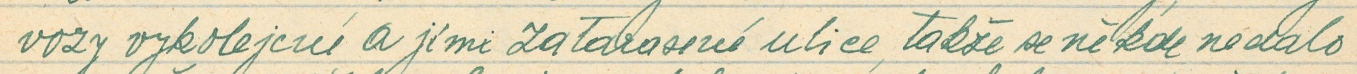vozy vykolejené a jimi zatarasené ulice, takže se někde nedalo
